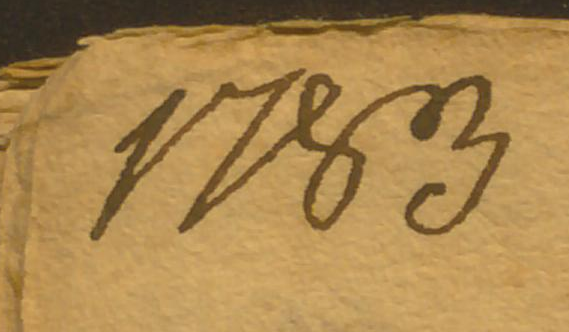1783
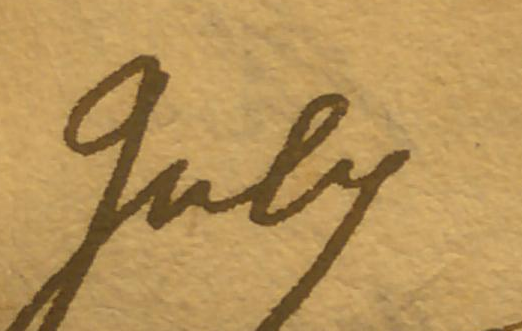July
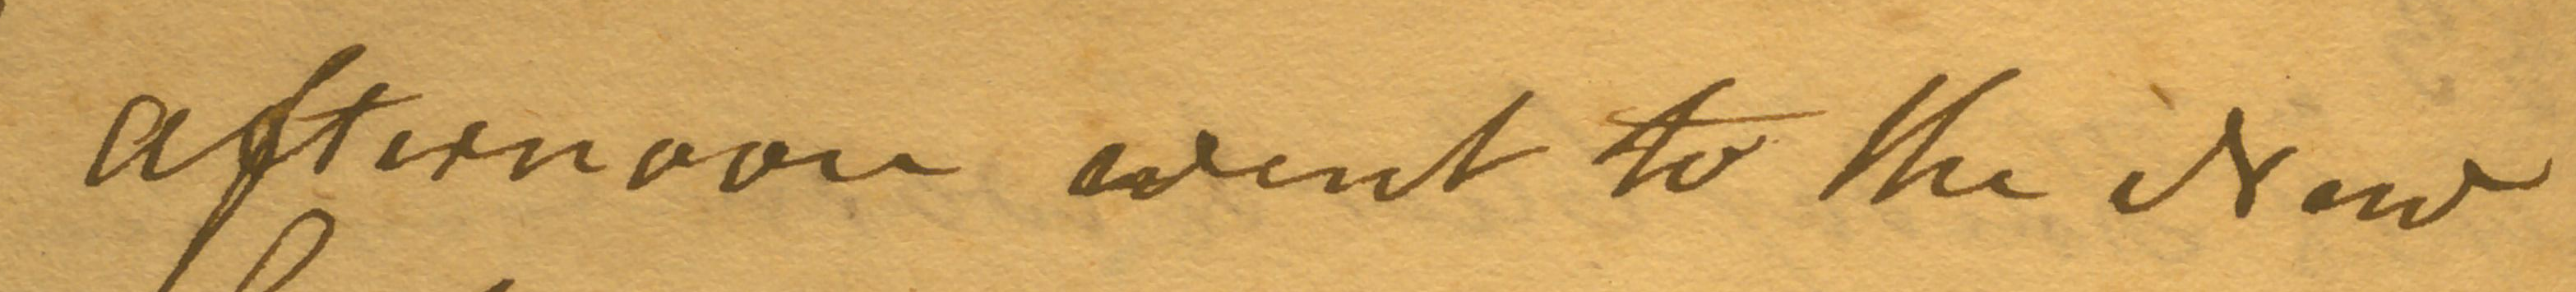Afternoon went to the New
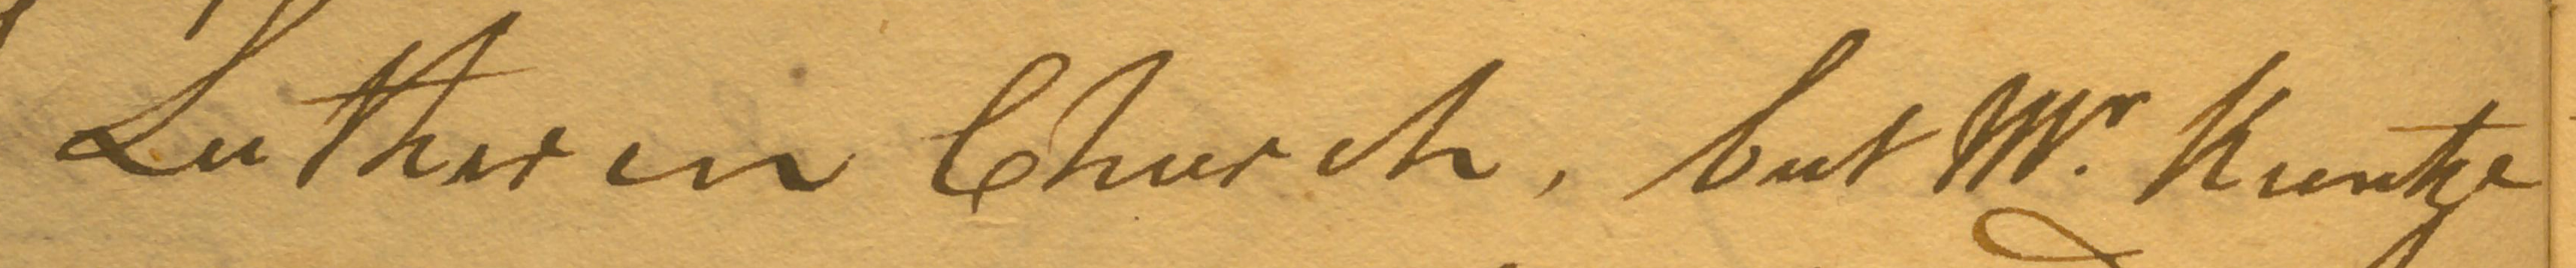Lutheren Church, but M^r. Kuntze
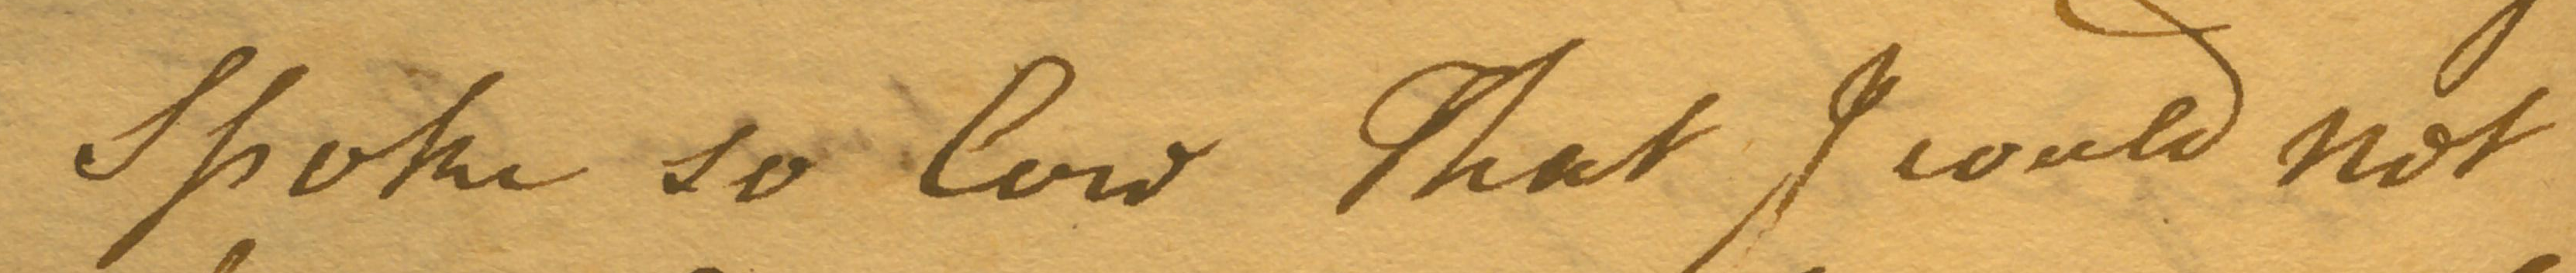Spoke so low That I could not
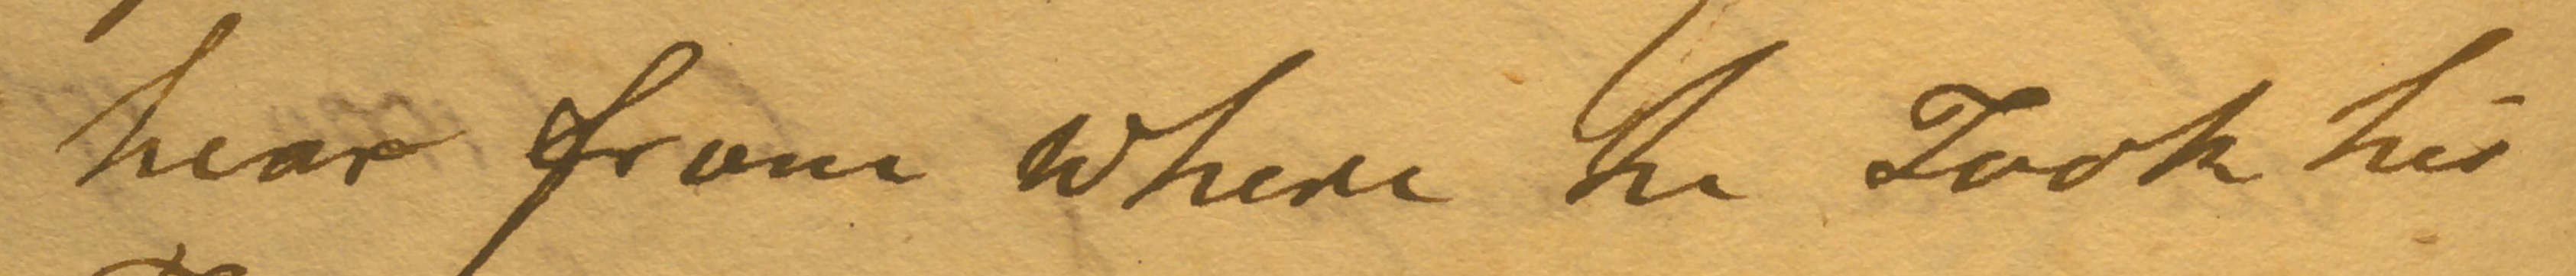hear from where he Took his
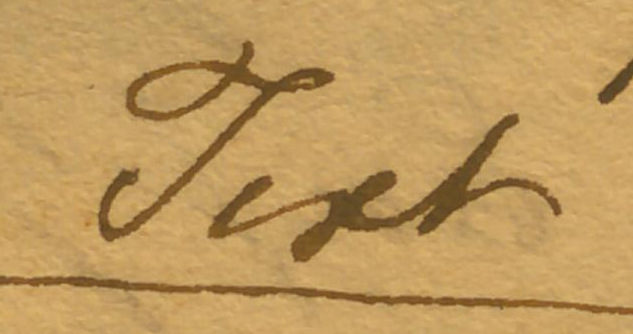Text
